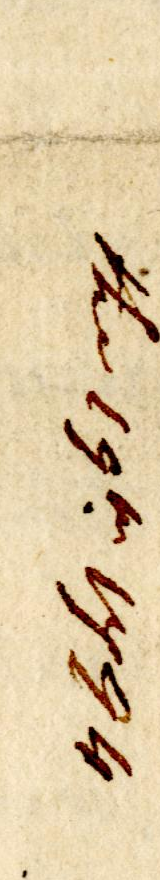the 19^th 1794
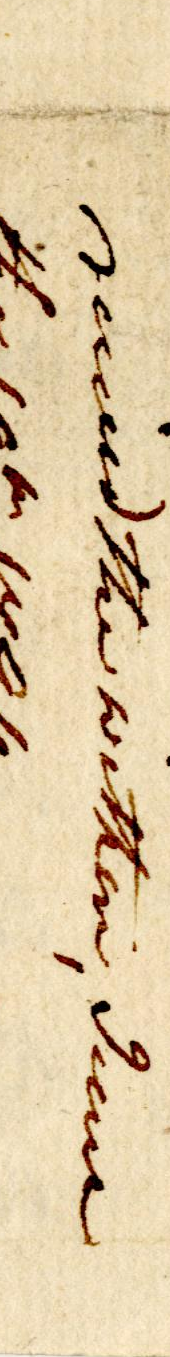received the within, June
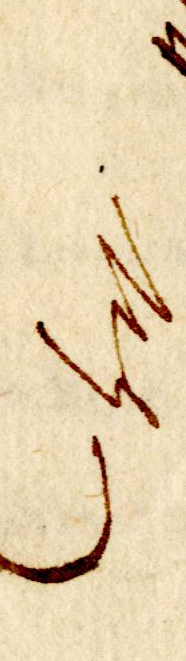M G
